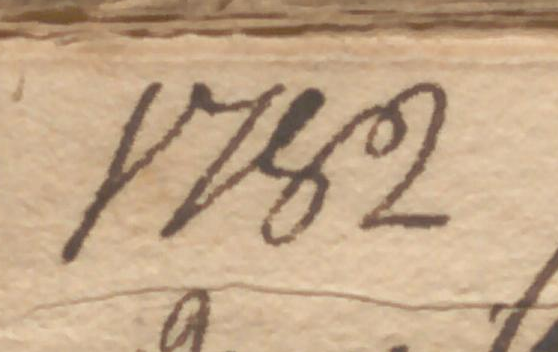1782
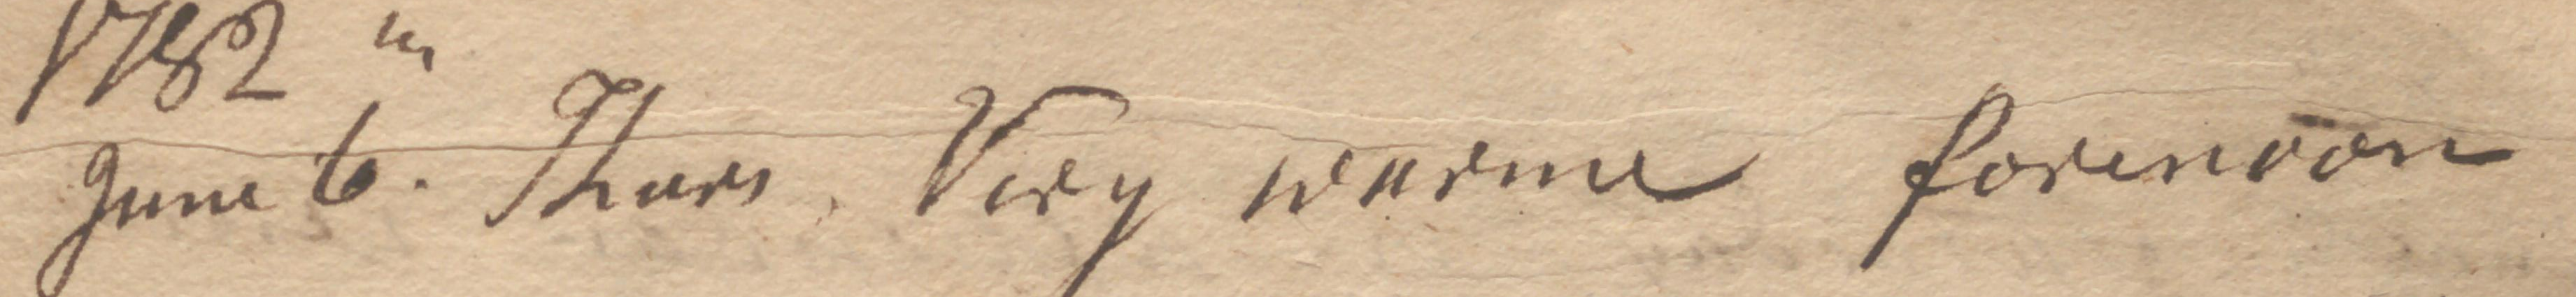June 6^th. Thurs. Very warme forenoon
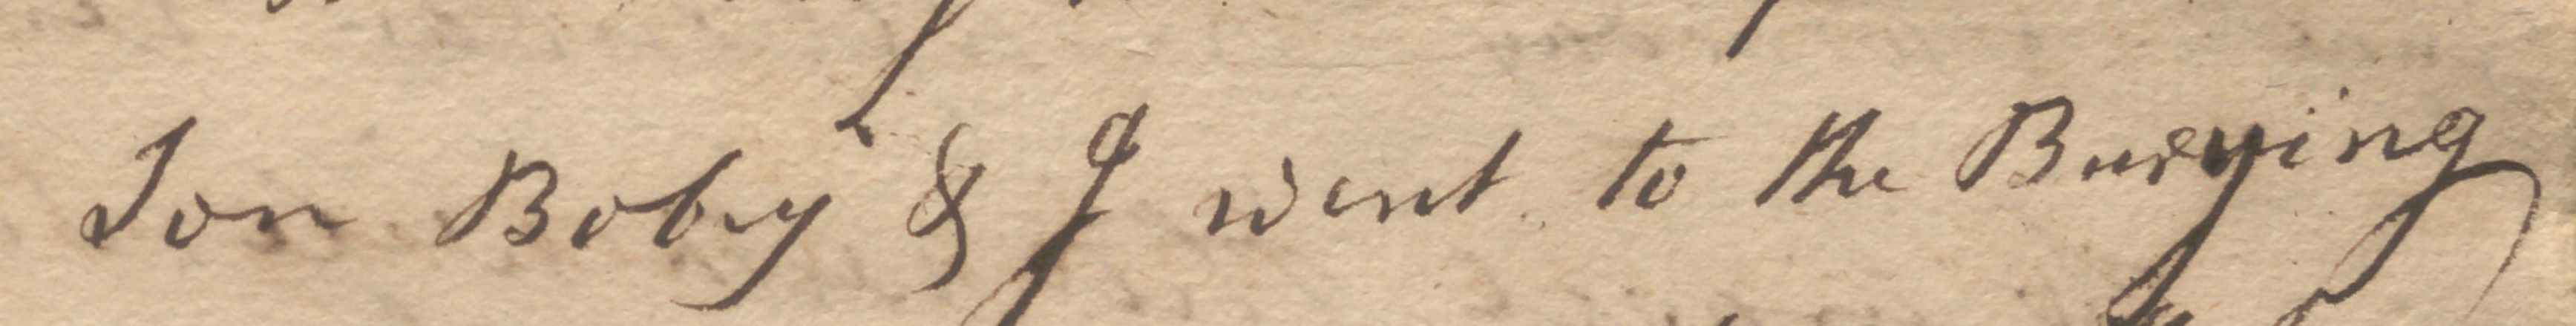Son Bobey & I went to the Burying
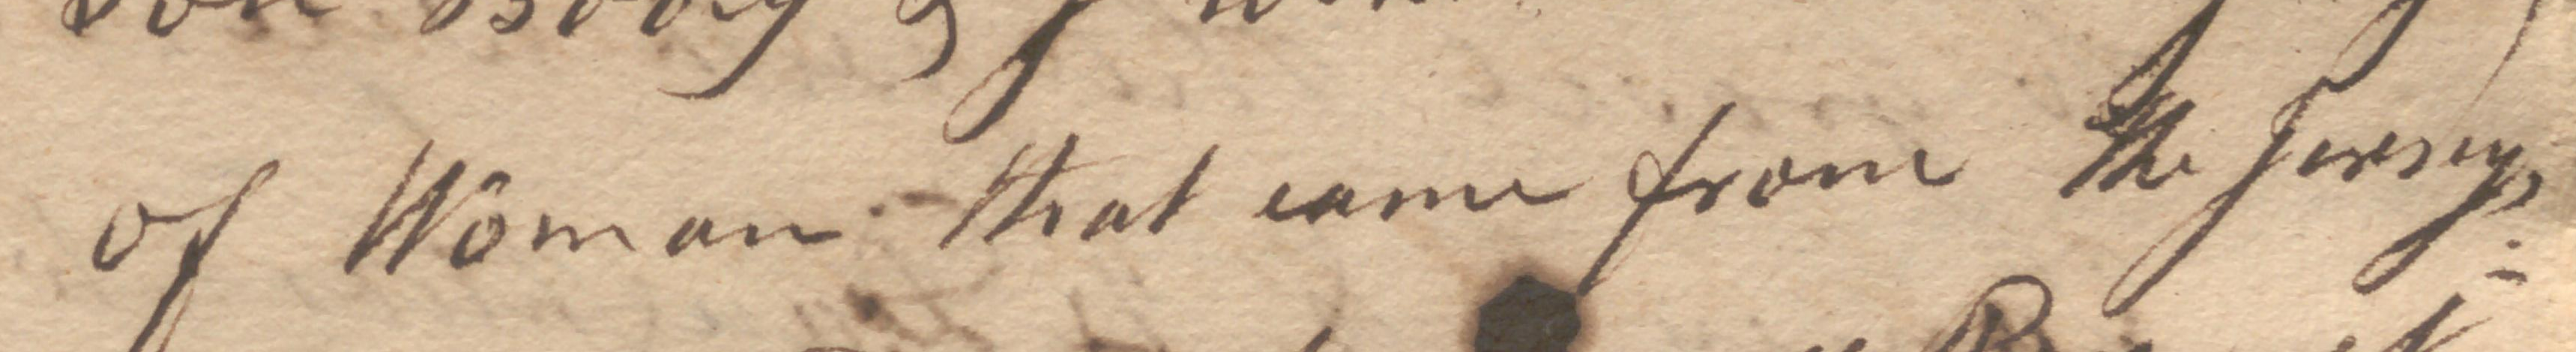of Woman that came from the Jersey
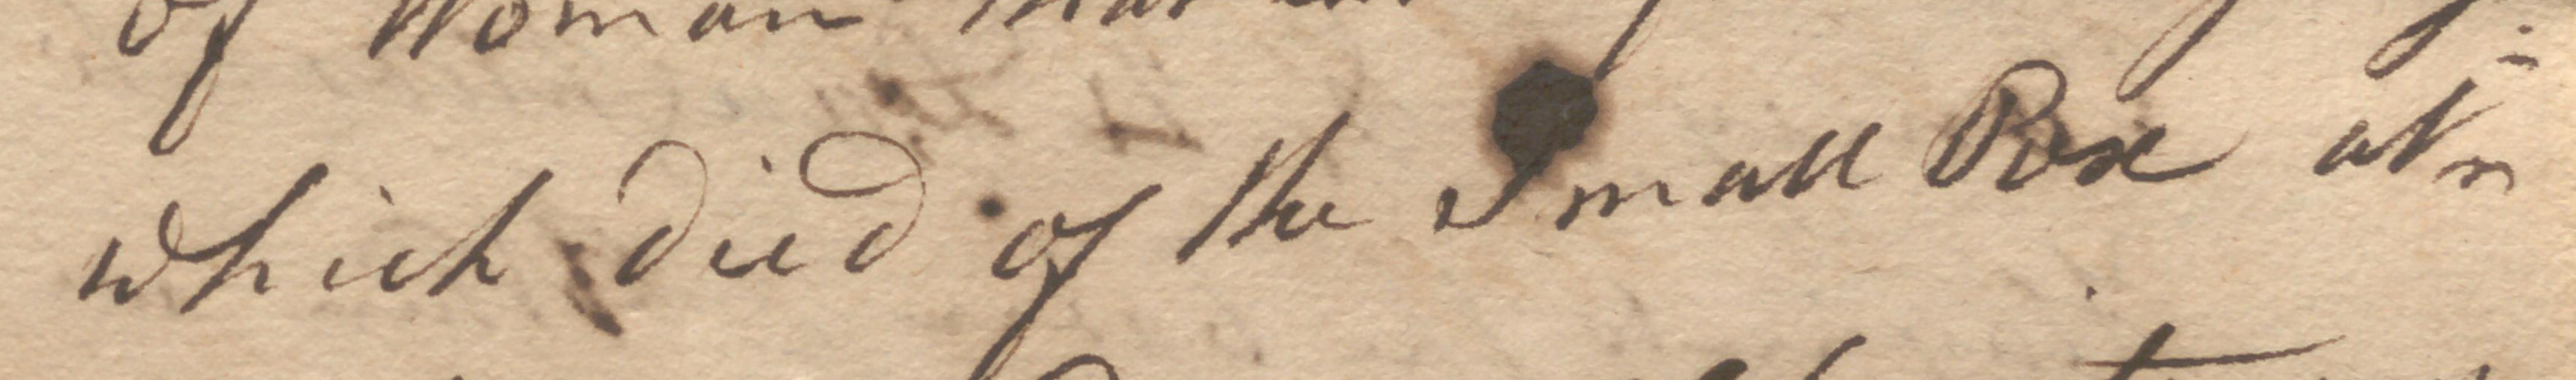which died of the small Pox at
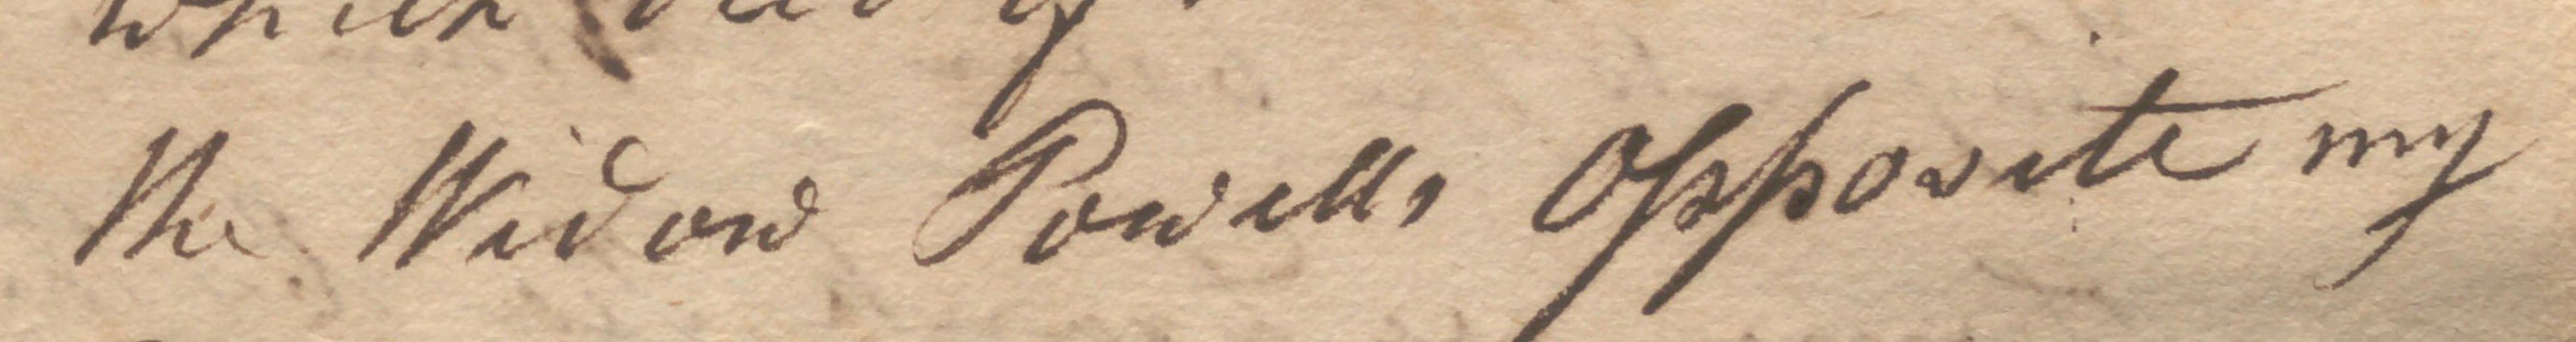the Widow Powells opposite my
